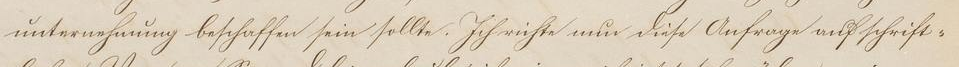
unternehmung beschaffen sein sollte. Ich richte nun diese Anfrage auf schrift-
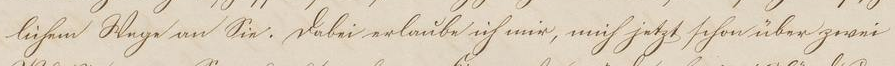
lichem Wege an Sie. Dabei erlaube ich mir, mich jetzt schon über zwei
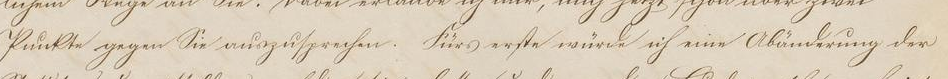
Punkte gegen Sie auszusprechen. Fürs erste würde ich eine Abänderung der
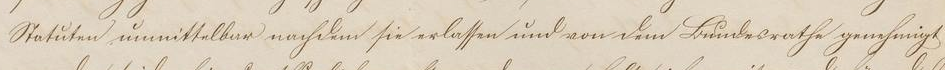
Statuten unmittelbar nachdem sie erlassen und von dem Bundesrathe genehmigt
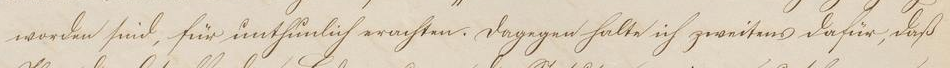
worden sind, für unthunlich erachten. Dagegen halte ich zweitens dafür, daß
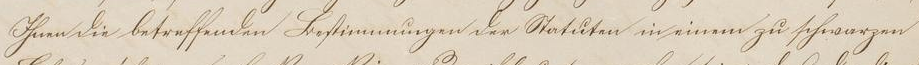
Ihnen die betreffenden Bestimmungen der Statuen in einem zu schwarzen
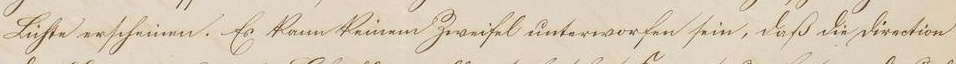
Lichte erscheinen. Es kann keinem Zweifel unterworfen sein, daß die Direction
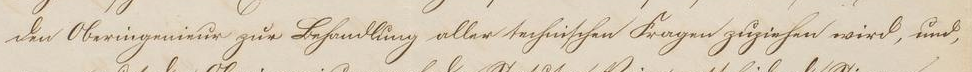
den Oberingenieur zur Behandlung aller technischen Fragen zuziehen wird, und,
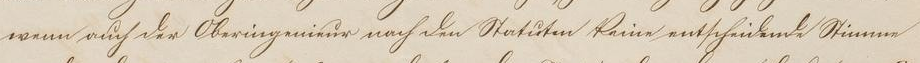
wenn auch der Oberingenieur nach den Statuten keine entscheidende Stimme
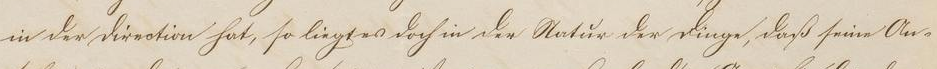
in der Direction hat, so liegt es doch in der Natur der Dinge, daß seine An-
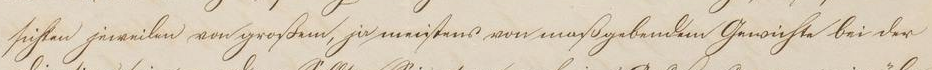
sichten jeweilen von großem, ja meistens von maßgebendem Gewichte bei der
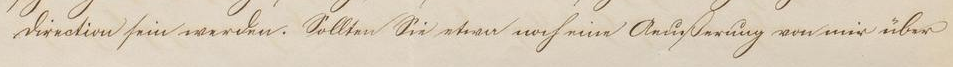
Direction sein werden. Sollten Sie etwa noch eine Aeußerung von mir über
